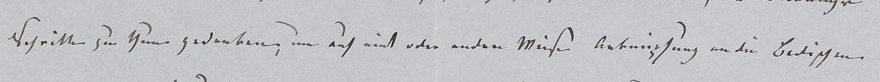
Schritte zu thun gedenken, um auf eint oder ander Weise Anknüpfung an die Badischen
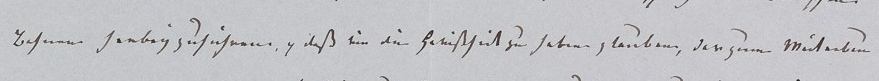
Bahnen herbeyzuführen, & daß wir die Gewißheit zu haben glauben, das zum Weiterbau
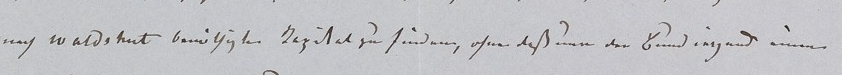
nach Waldshut benöthigte Kapital zu finden, ohne daß uns der Bund irgend einen
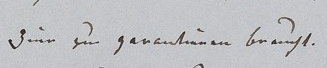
Zins zu garantieren braucht.
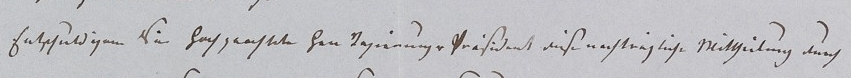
Entschuldigen Sie hochgeachteter Herr Regierungs Präsident diese nachträgliche Mittheilung durch
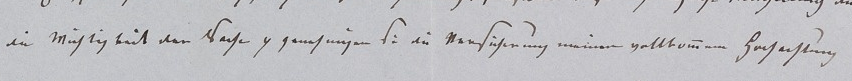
die Wichtigkeit der Sache & genehmigen sie die Versicherung meiner vollkommnen Hochachtung
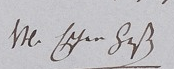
M. Escher Heß
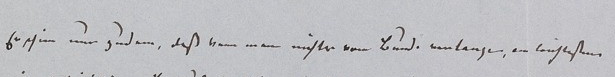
Es schien uns zudem, daß wenn man nichts vom Bund verlange, am leichtesten
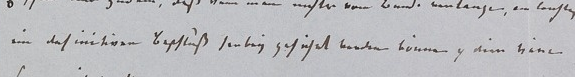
ein definitiver Beschluß herbey geführt werden könne & dies wäre
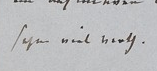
schon viel werth.
